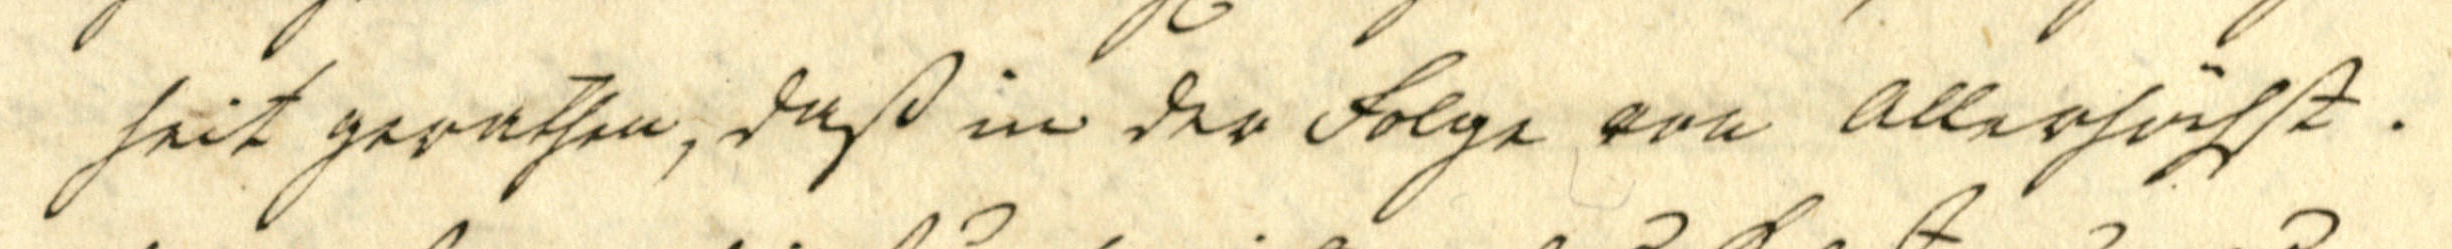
heit gerathen, daß in der Folge von Allerhöchst¬
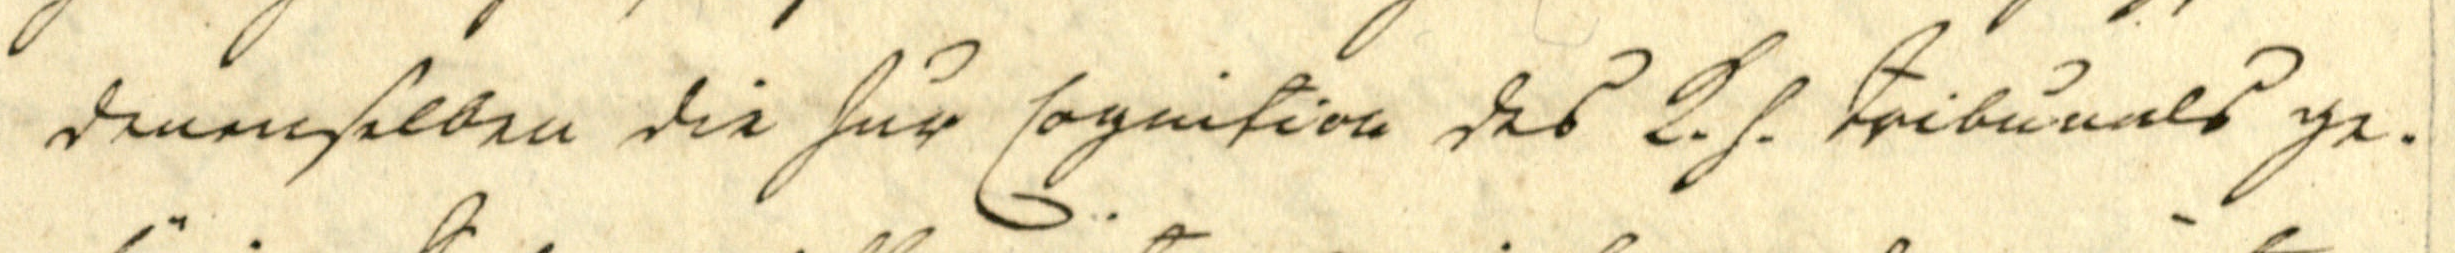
demselben die zur Cognition des K. H. Tribunals ge¬
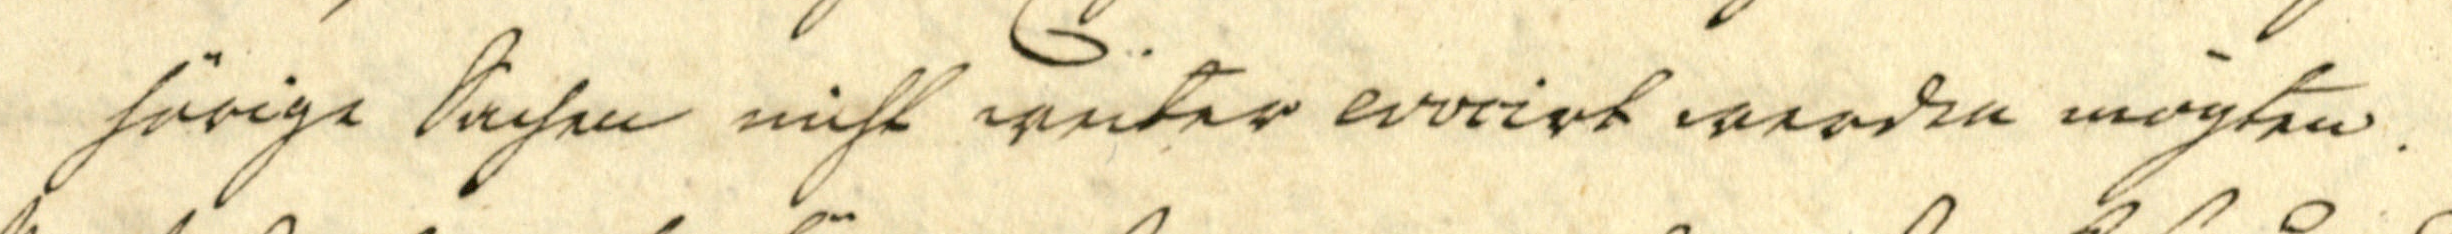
hörige Sachen nicht weiter evocirt werden mögten.
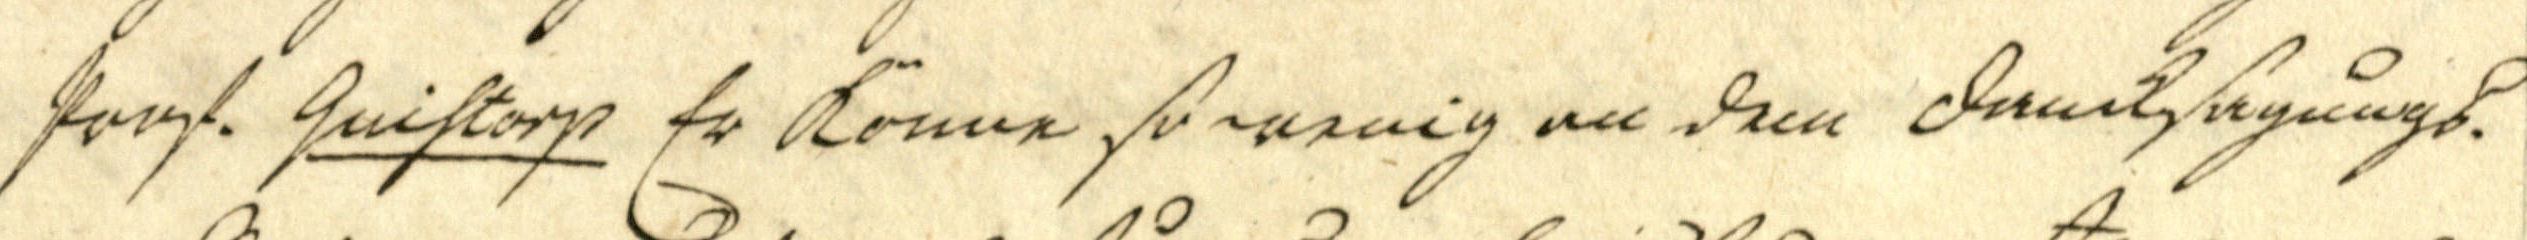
Prof. Quistorp Er könne so wenig an dem Dancksagungs
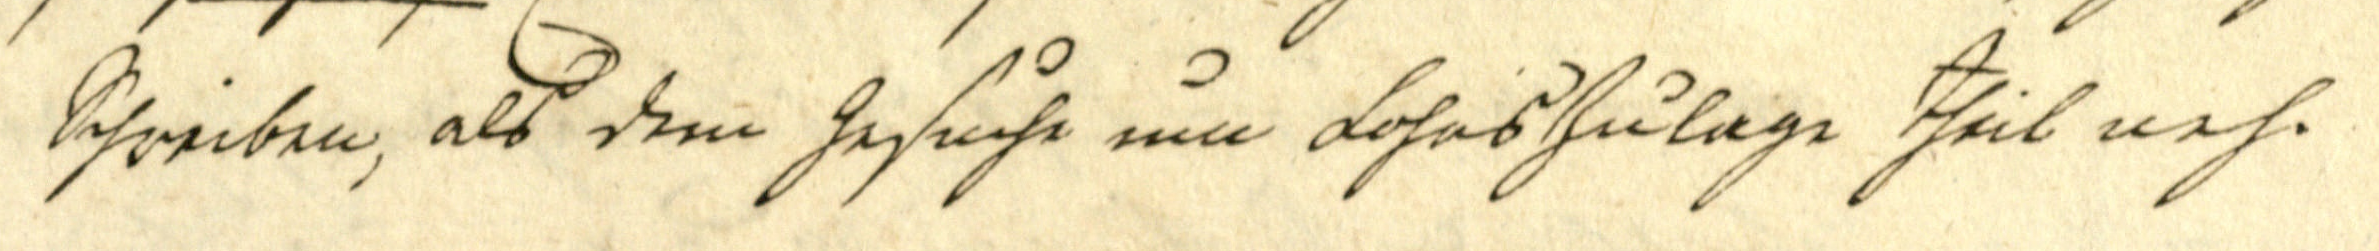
Schreiben, als dem Gesuche um LohnsZulage Theil neh¬
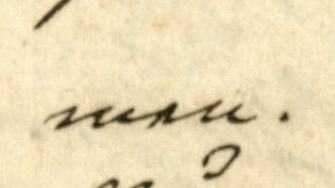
men.
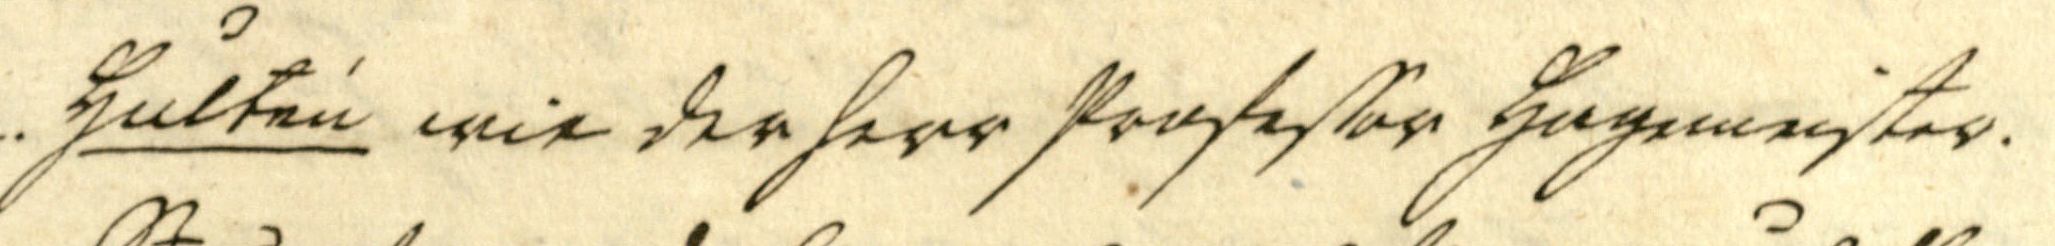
Hultén wie der Herr Professor Hagemeister.
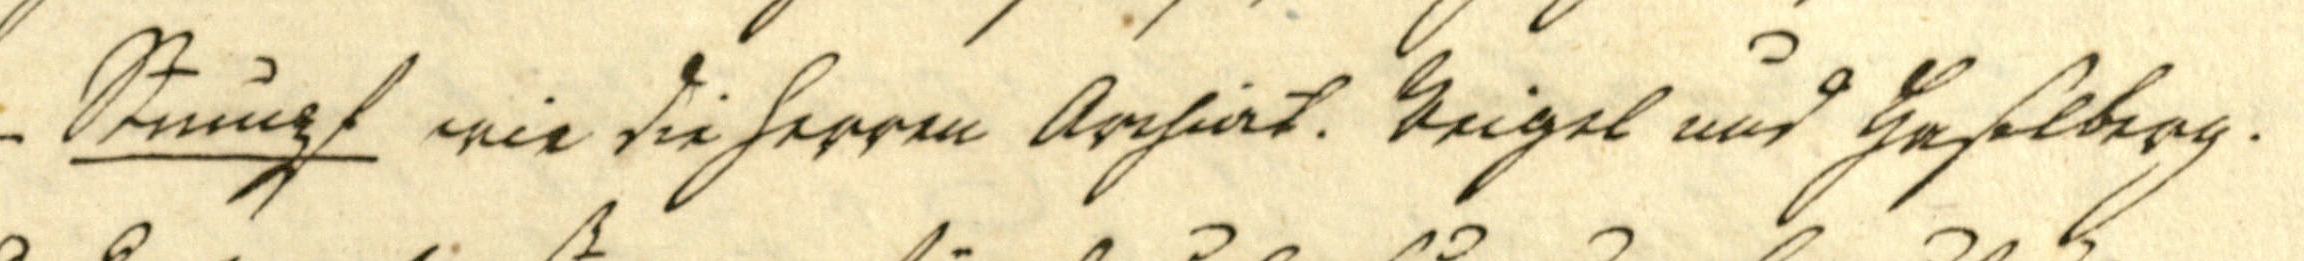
Stumpf wie die Herren Archiat. Weigel und Haselberg.
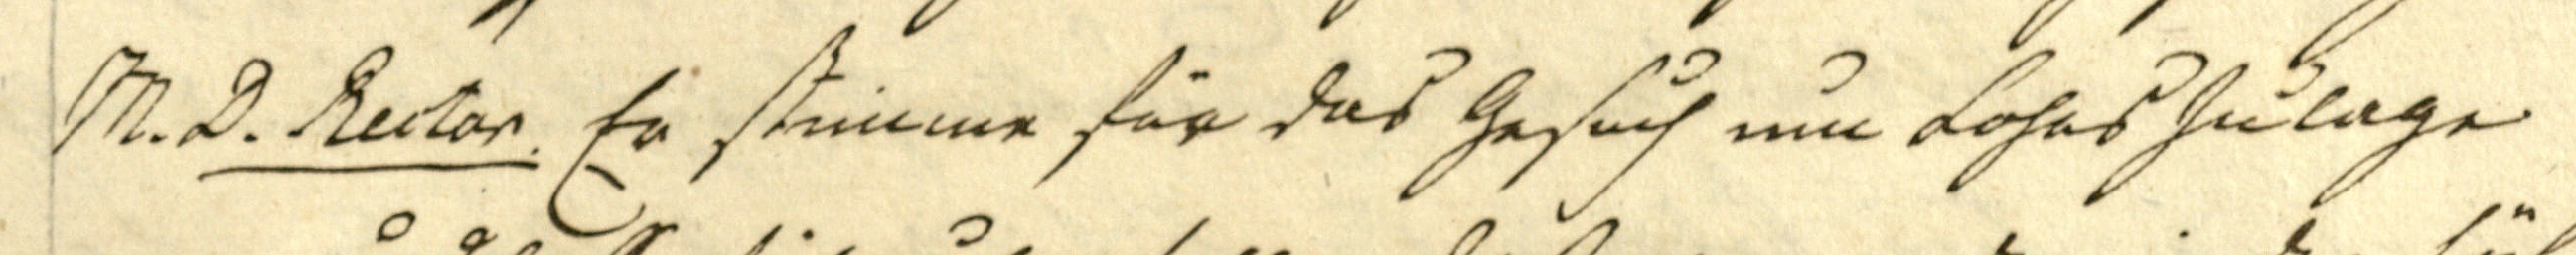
M. D. Rector. Er stimme für das Gesuch um Lohns Zulage
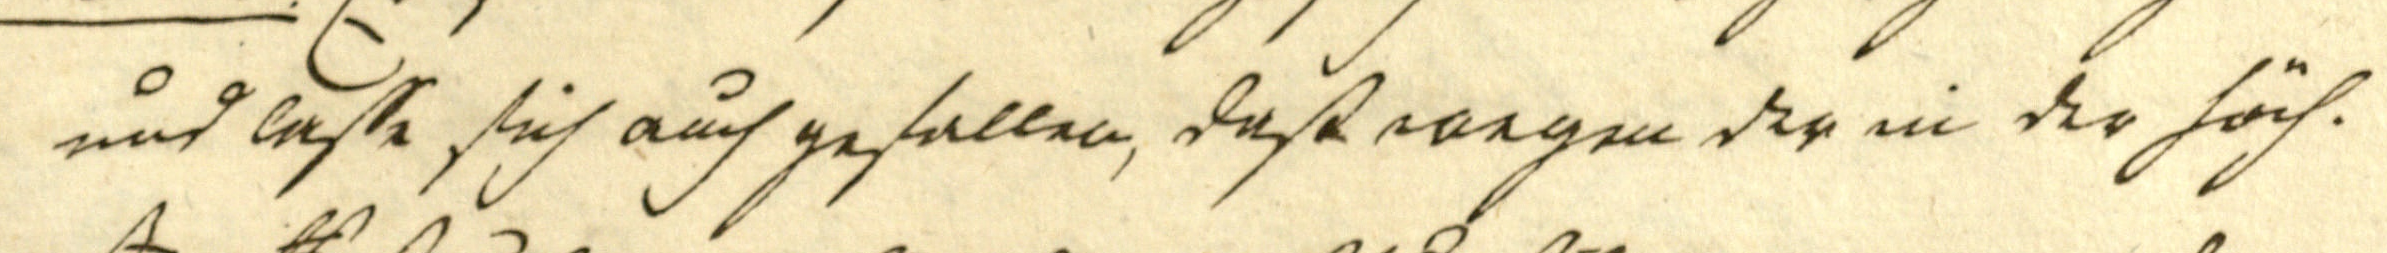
und lasse sich auch gefallen, daß wegen der in der höch¬
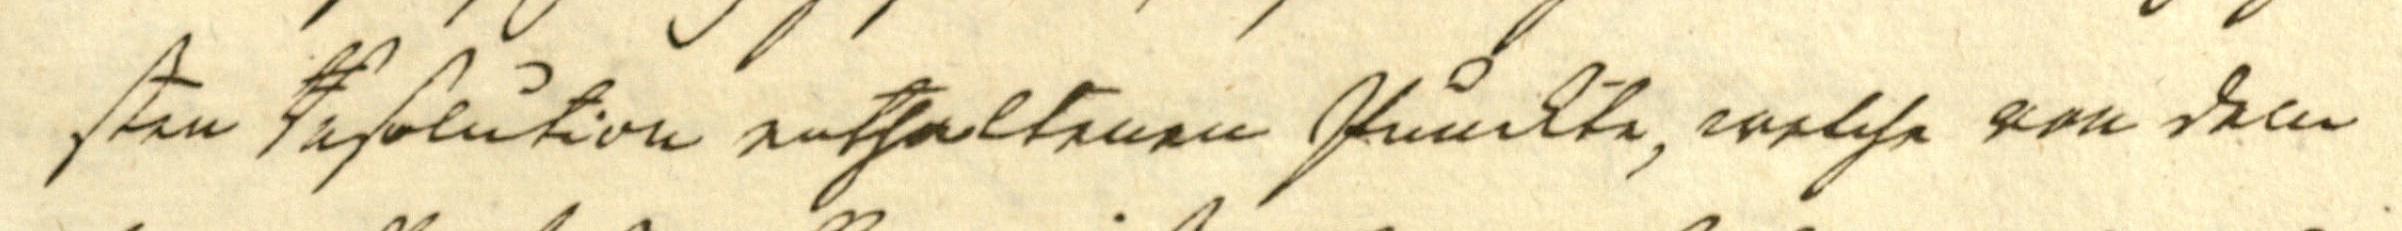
sten Resolution enthaltenen Punckte, welche von dem
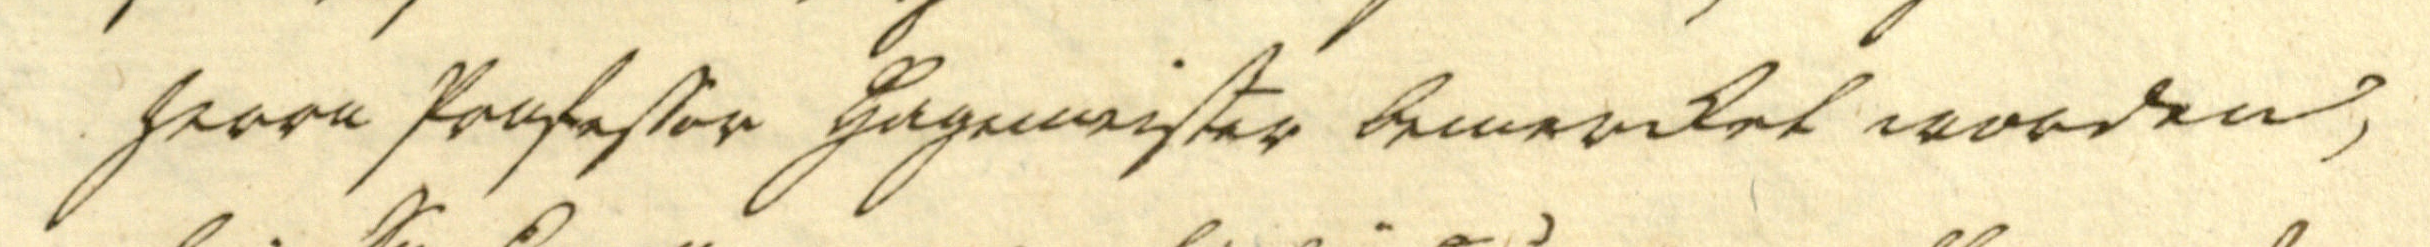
Herrn Professor Hagemeister bemercket worden,
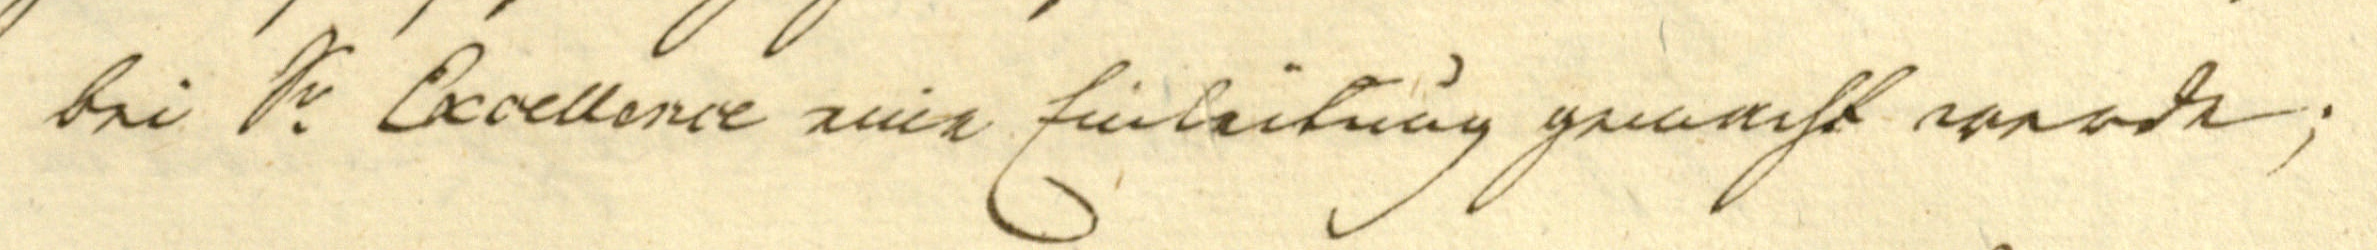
bei Sr Excellence eine Einleitung gemacht werde;
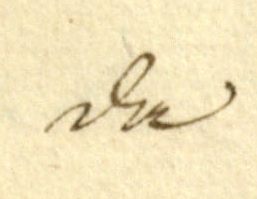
da
